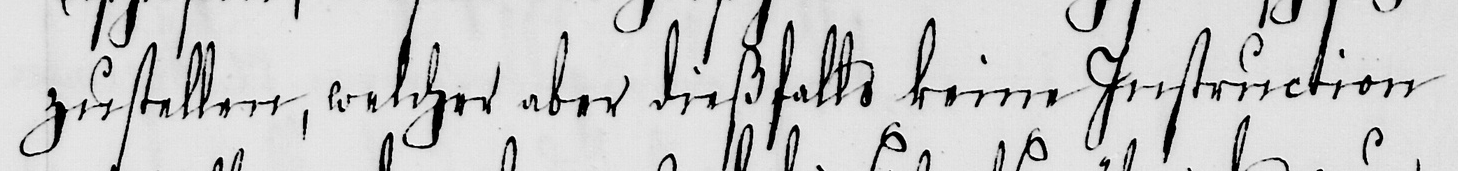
zustellen, welcher aber dießfalls keine Instruction
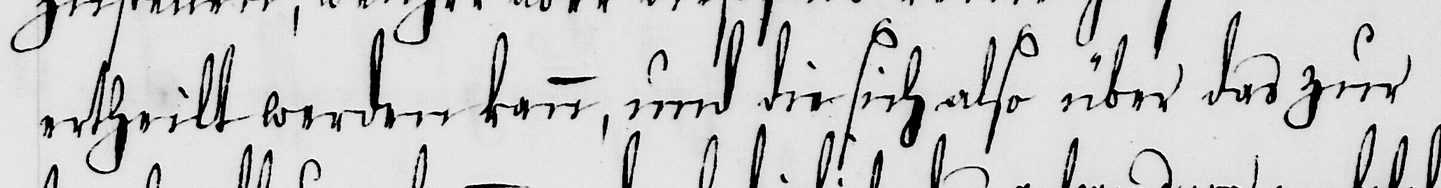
ertheilt werden kann, und die sich also über das zur
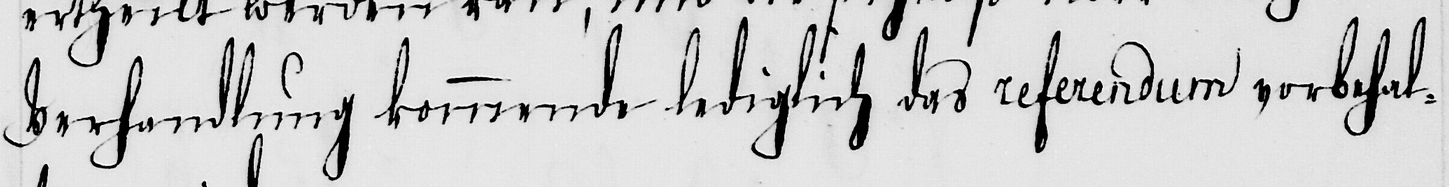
Verhandlung kommende lediglich das referendum vorbehal¬
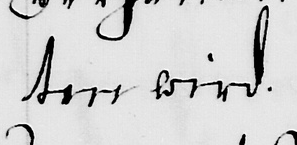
ten wird.
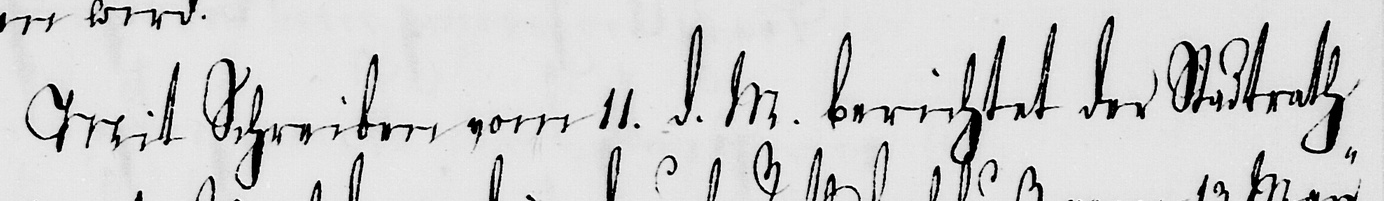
Mit Schreiben vom 11. d. M. berichtet der Stadtrath
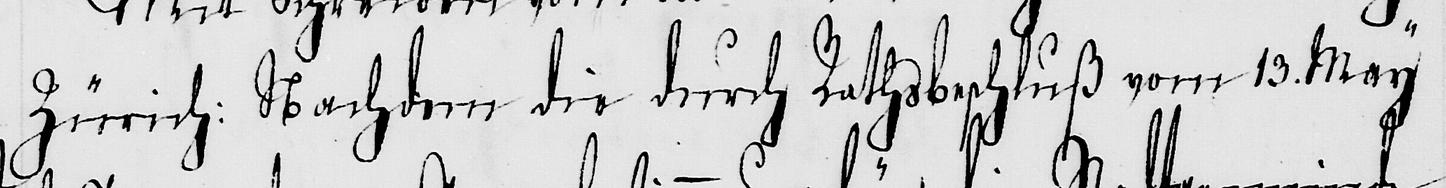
Zürich: Nachdem die durch Rathsbeschluß vom 13. May
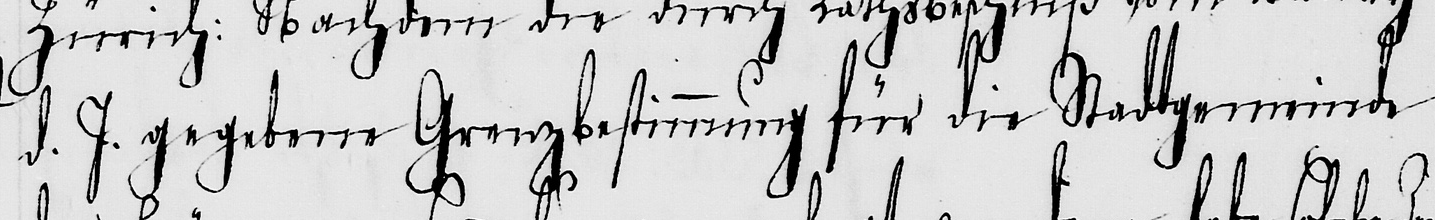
d. J. gegebene Grenzbestimmung für die Stadtgemeinde
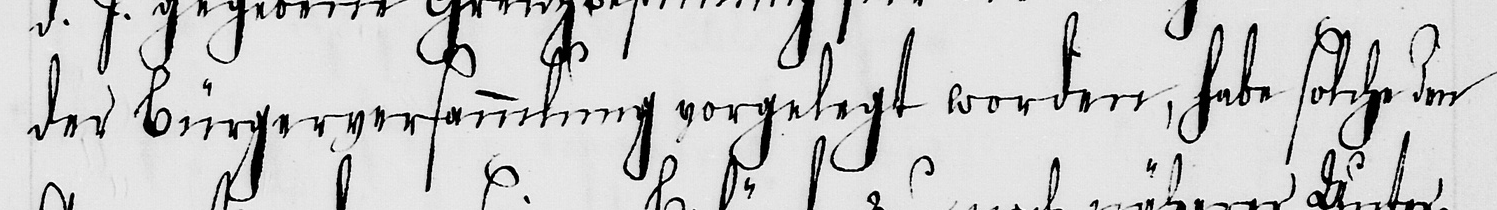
der Bürgerversammlung vorgelegt worden, habe solche den
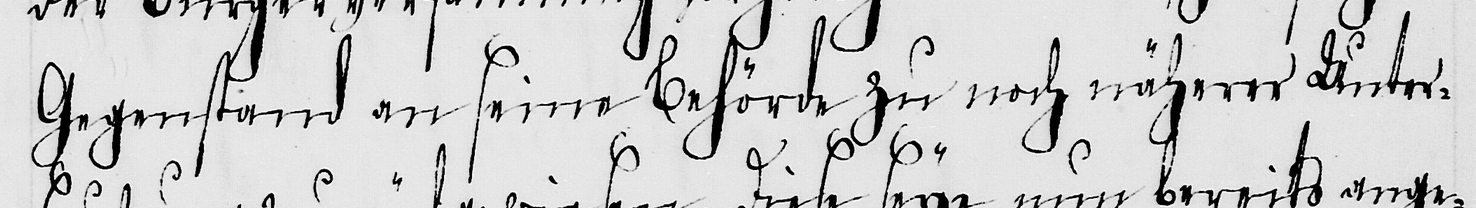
Gegenstand an seine Behörde zu noch näherer Unter¬
